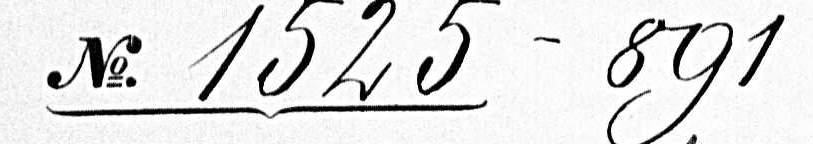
No 1525– 1891
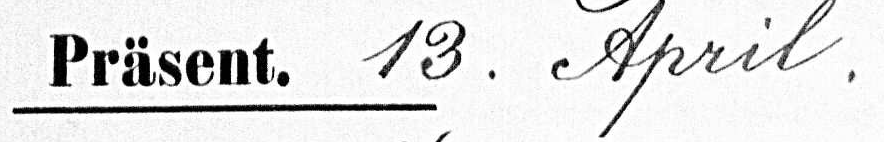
Präsent. – 13. April
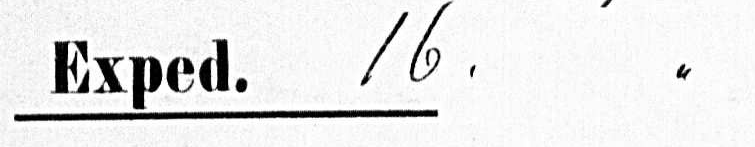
Exped. – 16. „
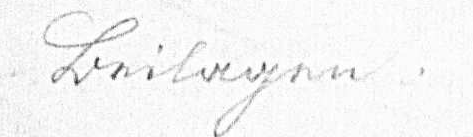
Beilagen
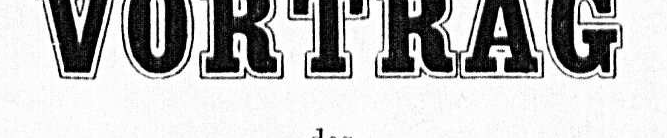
VORTRAG
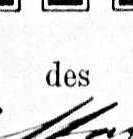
des
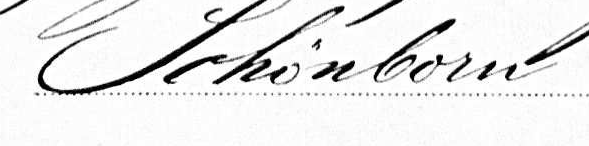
Schönborn
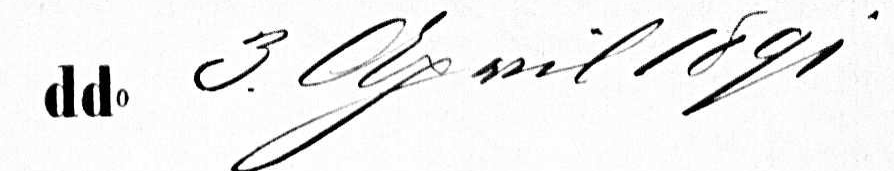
Ddo 3. April 1891
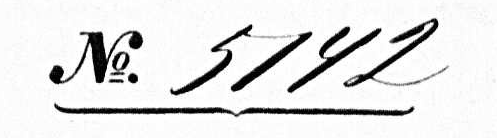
No. 5142
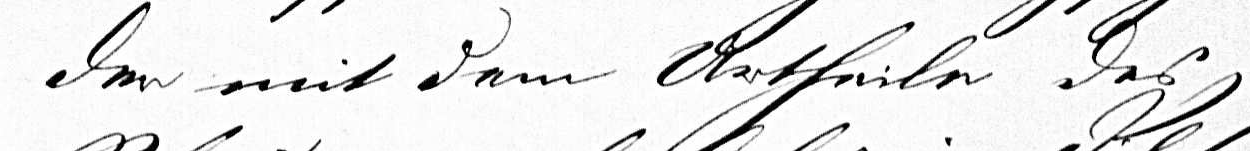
der mit dem Urtheile des
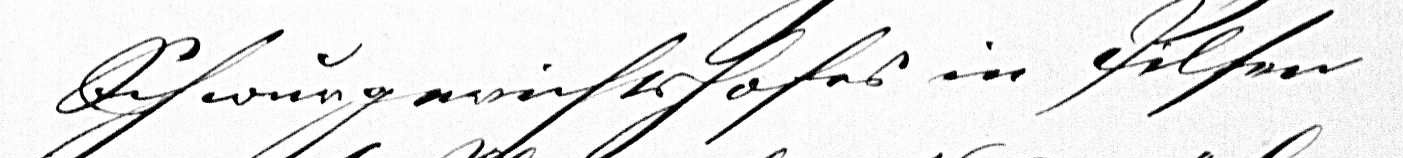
Schwrugerichtshofes in Pilsen
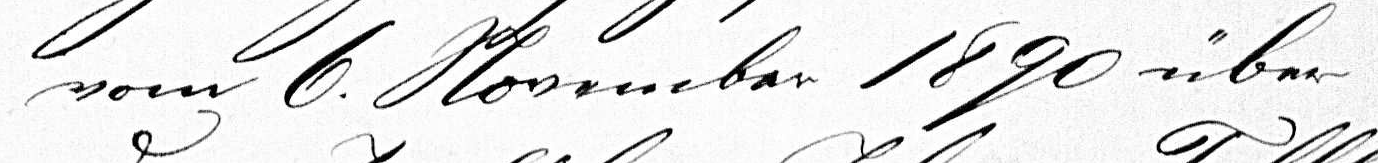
vom 6. November 1890 über
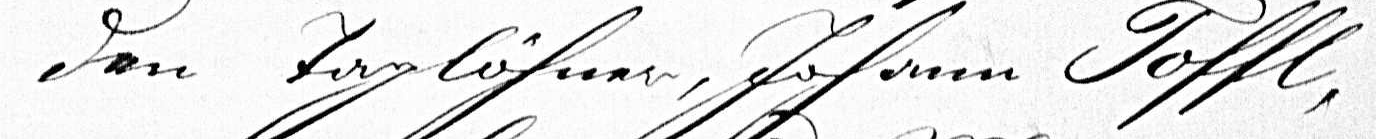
den Taglöhner, Johann Toffl,
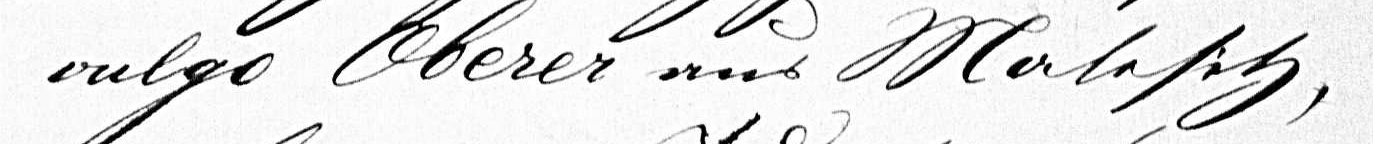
vulgo Oberer aus Malesitz
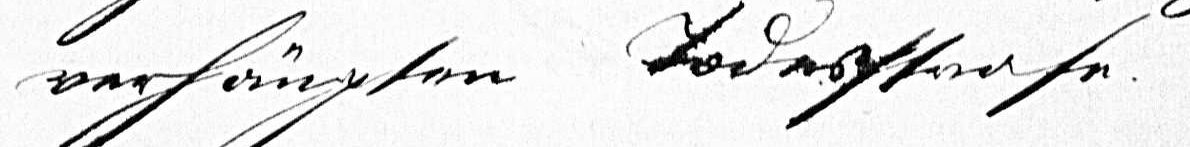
verhängten Todesstrafe.
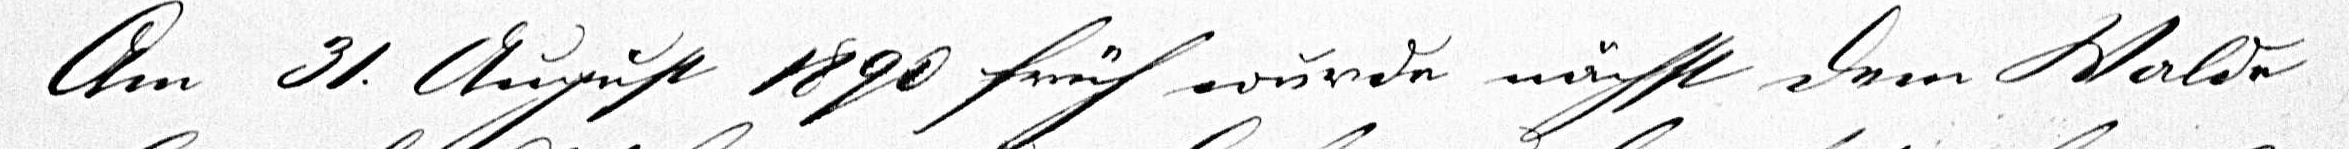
Am 31. August 1890 früh wurde nächst dem Walde
